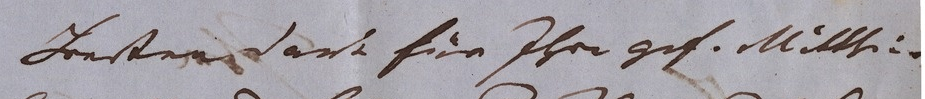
Besten Dank für Ihre gef. Mitthei-
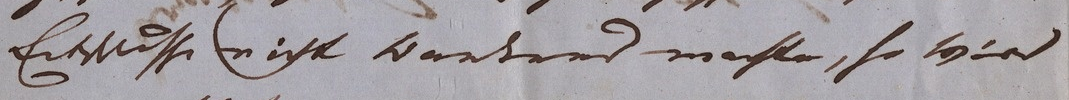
Entschlusse nicht wendend machte, so wird
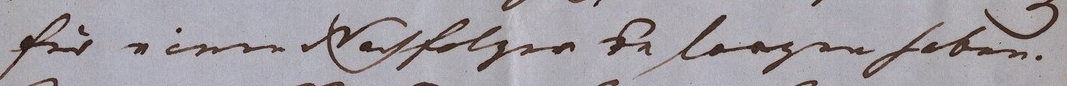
für einen Nachfolger zu sorgen haben.
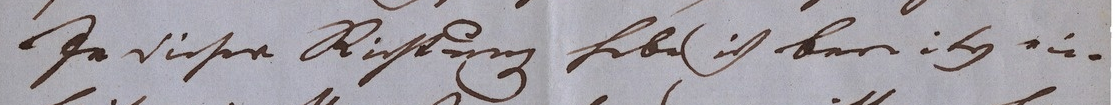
In dieser Richtung habe ich bereits ein-
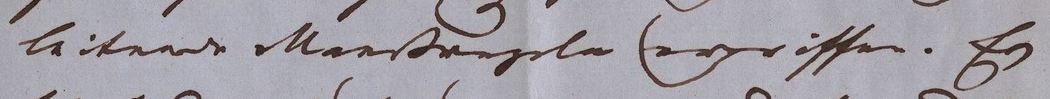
leitende Maaßregeln ergriffen. Es
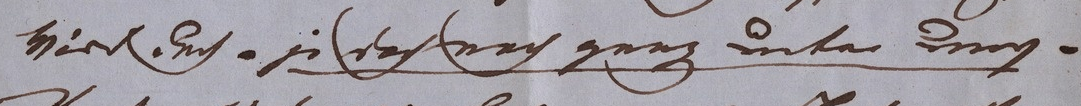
wird auch – jedoch noch ganz unter uns –
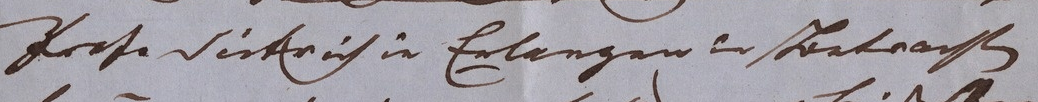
Prof. Dietrich in Erlangen in Betracht
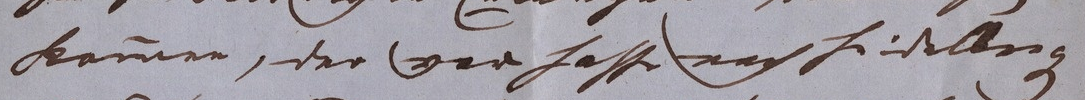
kommen, der vor Hasse nach Heidelberg
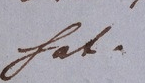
hat.
